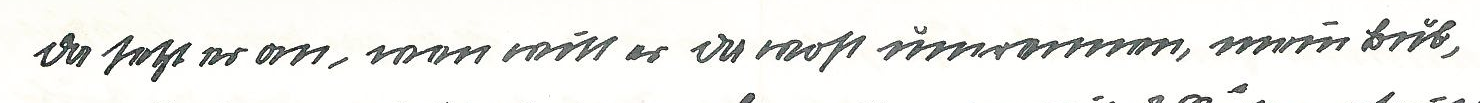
da setzt er an, wen will er da wohl umrennen, mein Bub,
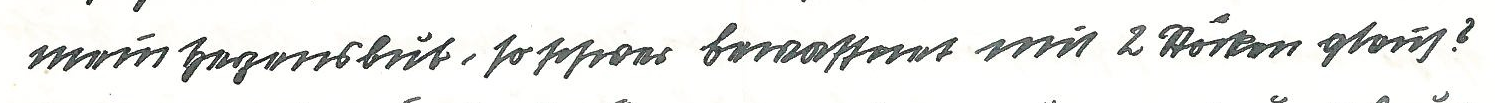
mein Herzensbub, so schwer bewaffnet mit 2 Stöcken gleich?
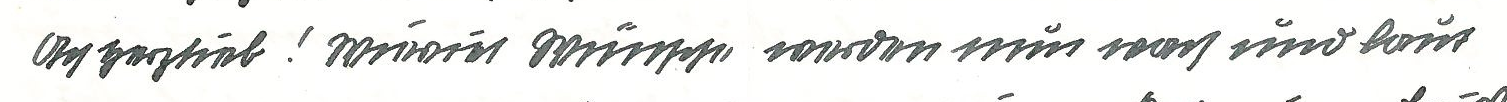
Ach Herzlieb! Wieviel Wünsche werden nun wach und laut
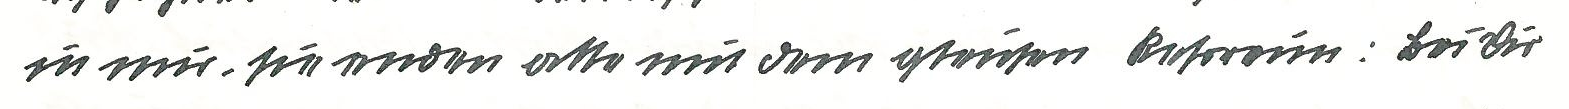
in mir, sie enden alle mit dem gleichen Kehrreim: Bei Dir
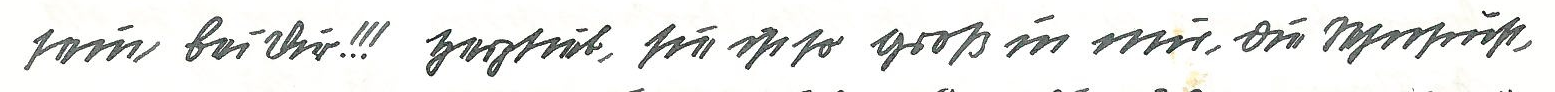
sein, bei Dir!!! Herzlieb, sie ist so groß in mir, die Sehnsucht,
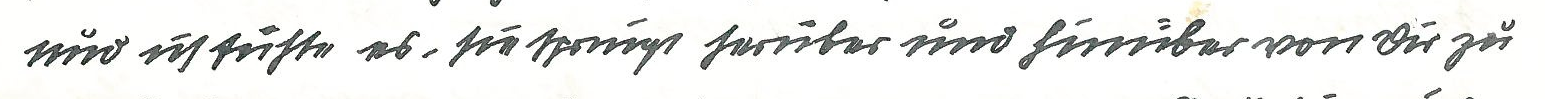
und ich fühle es, sie springt herüber und hinüber von Dir zu
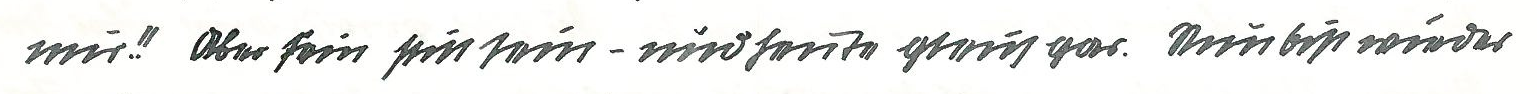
mir!! Aber fein still sein – und heute gleich gar. Nun bist wieder
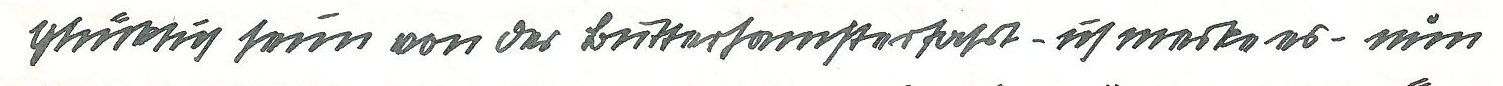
glücklich heim von der Butterhamsterfahrt – ich merke es – nun
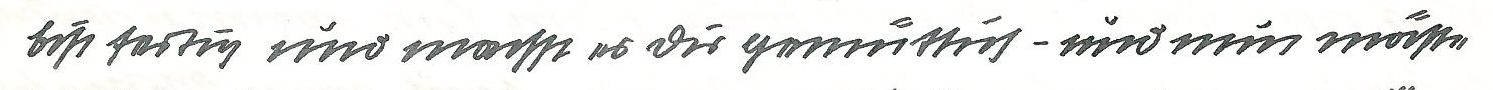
bist fertig und machst es Dir gemütlich – und nun möchte
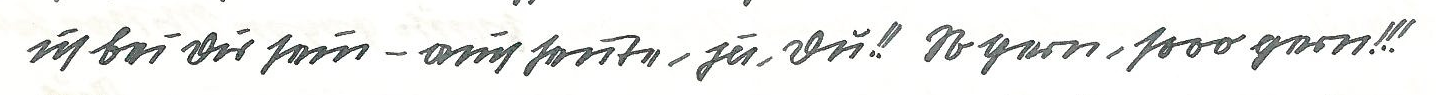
ich bei Dir sein – auch heute, ja, Du!! So gern, sooo gern!!!
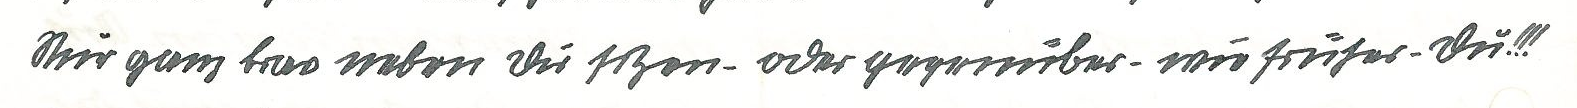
Nur ganz brav neben Dir sitzen – oder Dir gegenüber – wie früher – Du!!!
